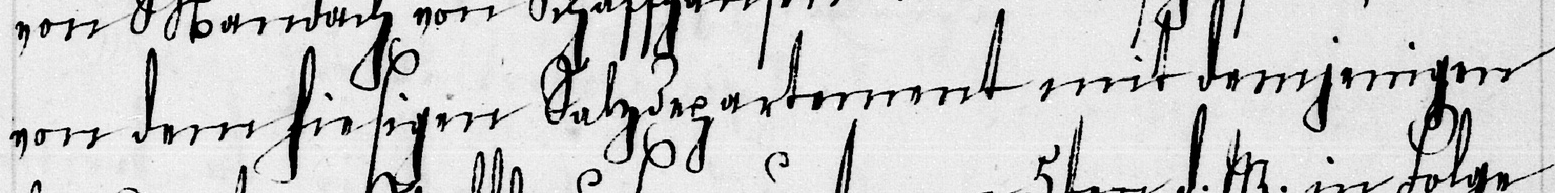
von dem hiesigen Salzdepartement mit demjenigen
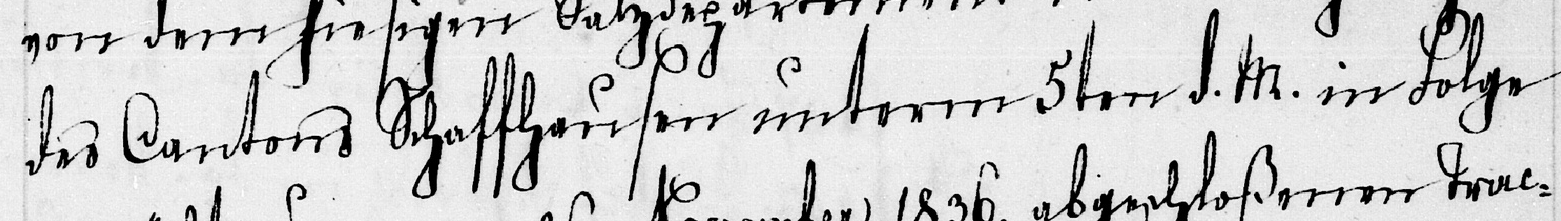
des Cantons Schaffhausen unterm 5ten d. M. in Folge
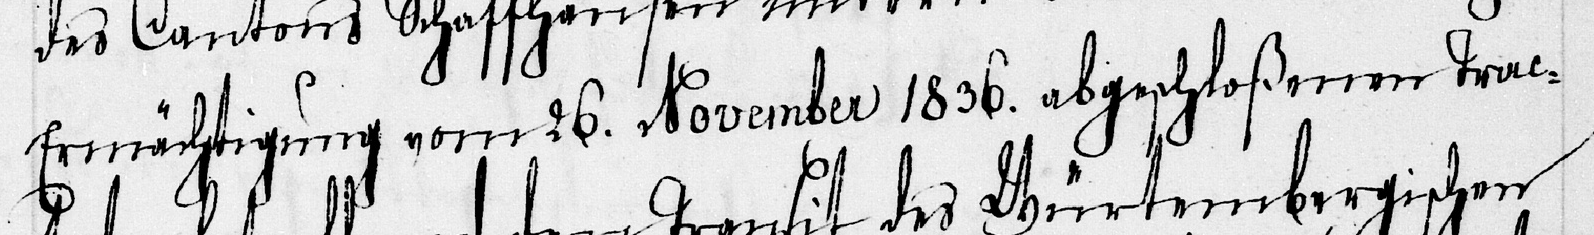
Ermächtigung vom 26. November 1836. abgeschloßenen Trac¬
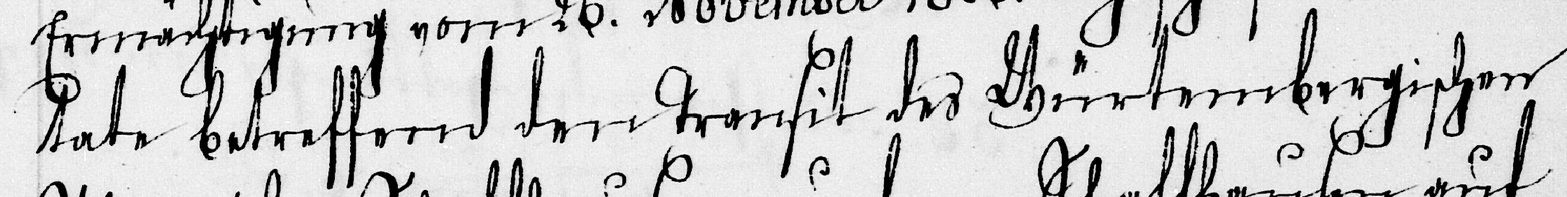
tate betreffend den Transit des Würtembergischen
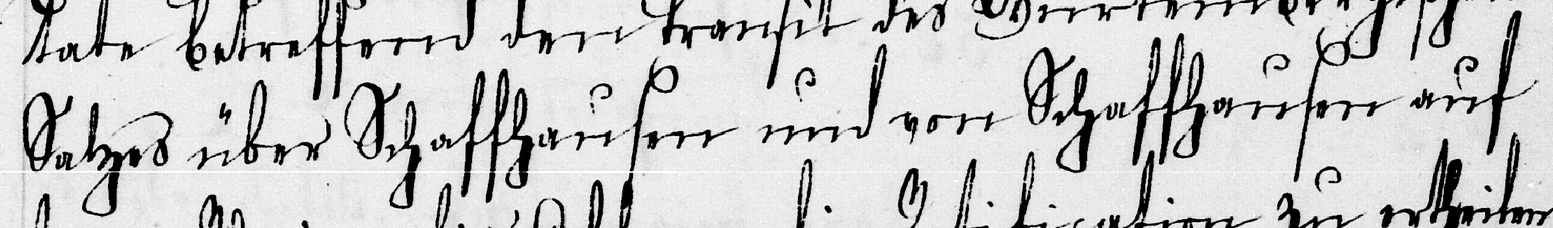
Salzes über Schaffhausen und von Schaffhausen auf
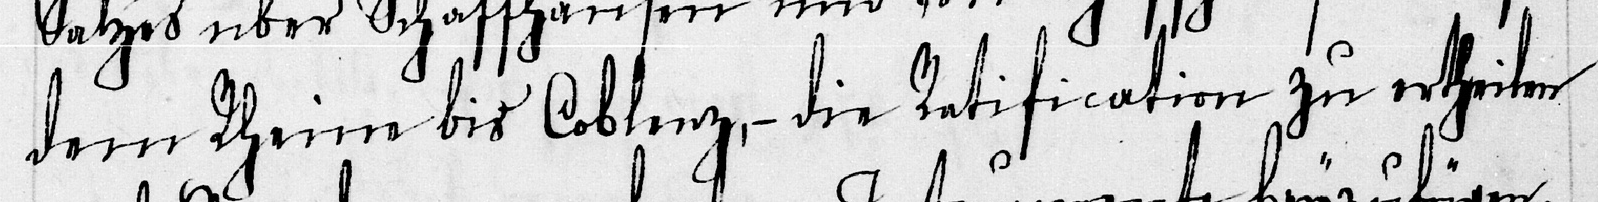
dem Rhein bis Coblenz, – die Ratification zu ertheilen
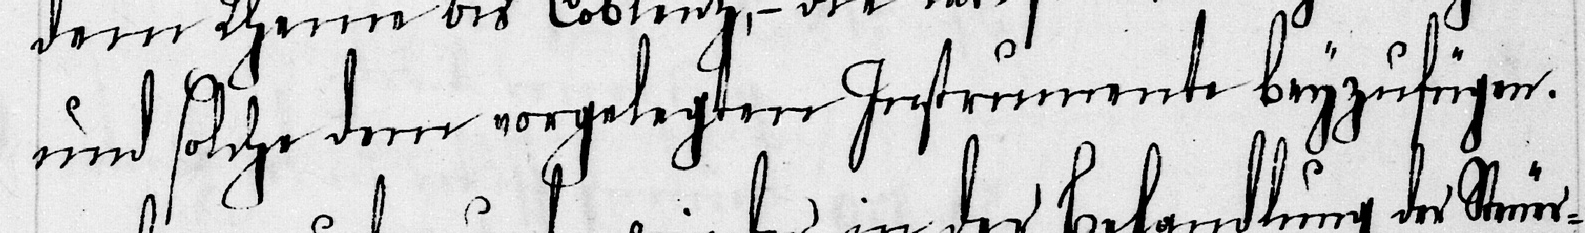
und solche dem vorgelegten Instrumente beyzufügen.
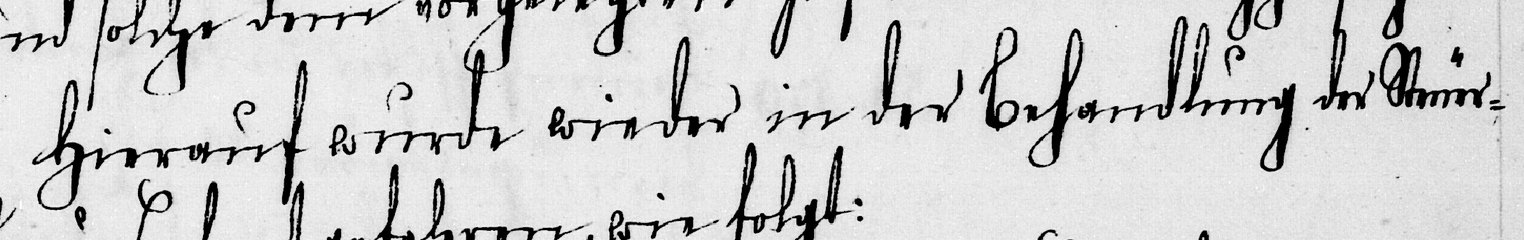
Hierauf wurde wieder in der Behandlung der Steue¬
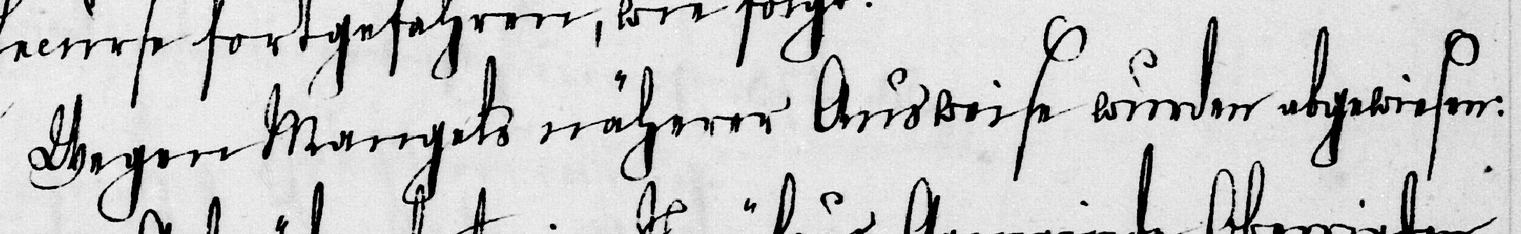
Wegen Mangels näherer Ausweise wurden abgewiesen:
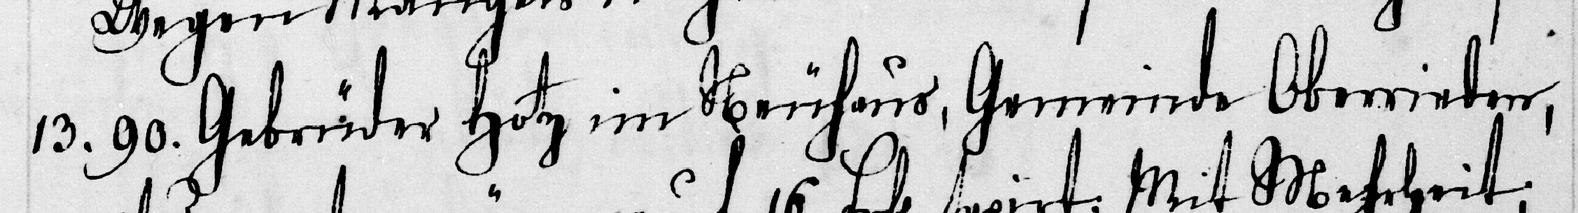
13. 90. Gebrüder Hotz im Neuhaus, Gemeinde Oberrieden,
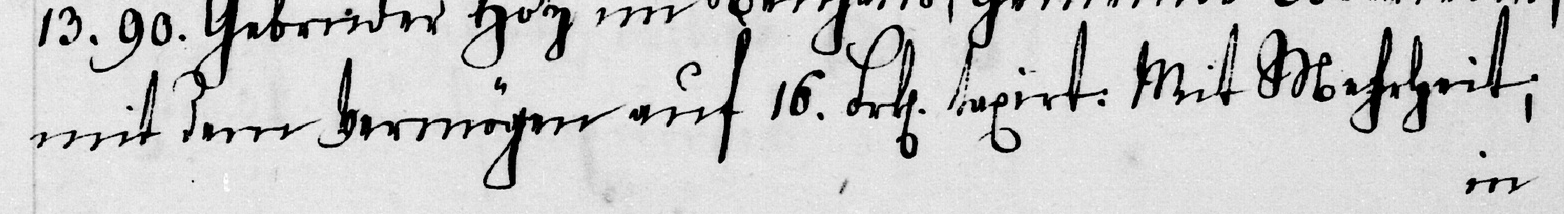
mit dem Vermögen auf 16. Frk[en]. taxiert: Mit Mehrheit;
